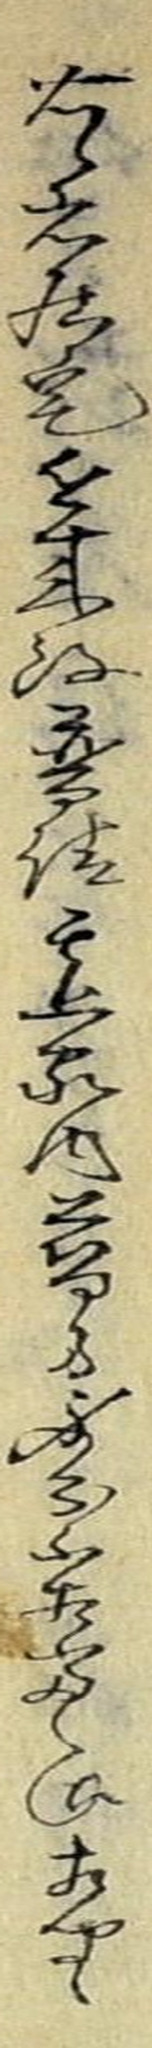右之者近来居宅致普請其上家内暮方身分不相当之趣相聞候
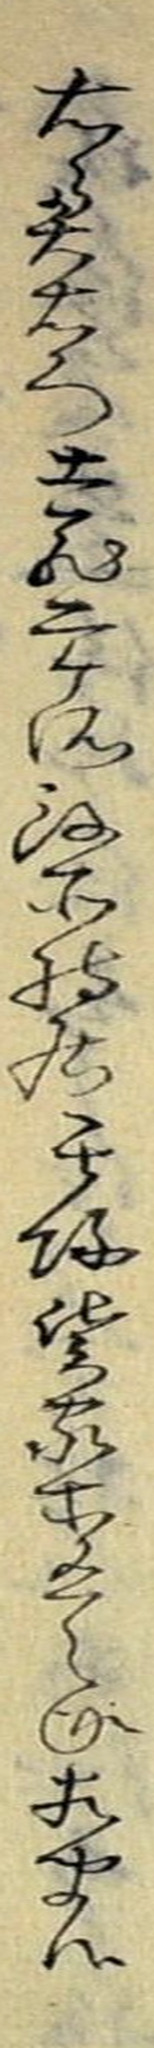右奥右衛門土蔵二ヶ所致所持居其餘貸家等有之趣相聞候
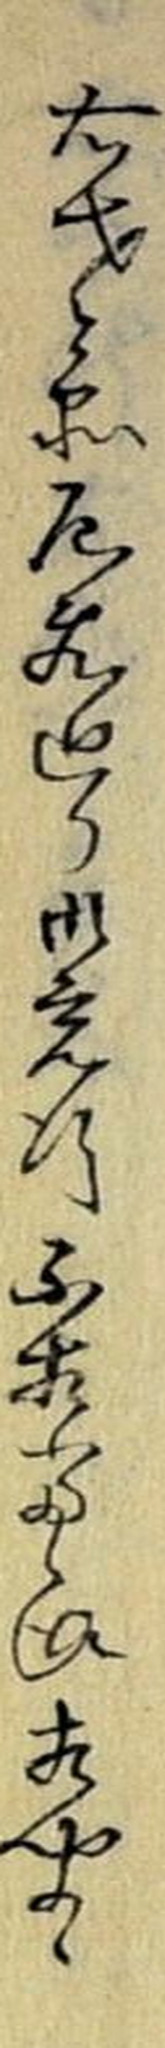右才兵衛屋敷廻り御充行不相当之趣相聞候
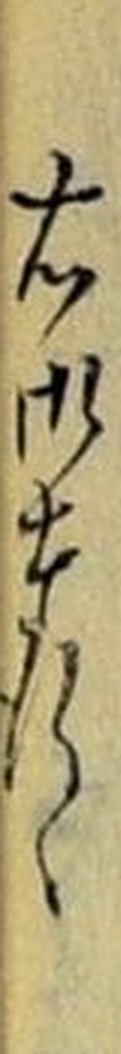右御奉行へ
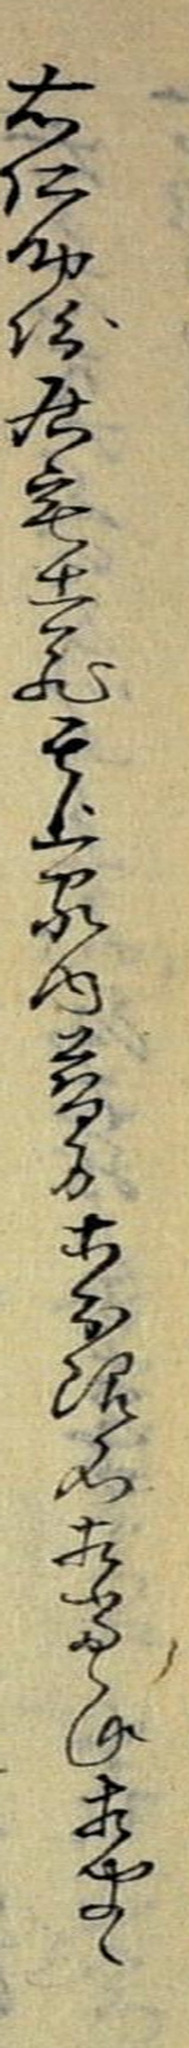右仁助儀居宅土蔵其上家内暮方等分限不相当之趣相聞候
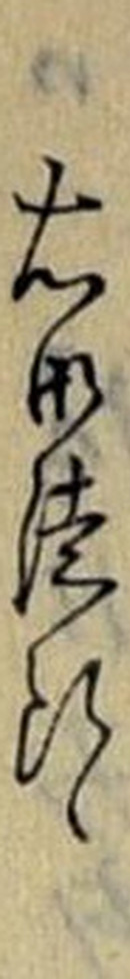右御徒頭へ
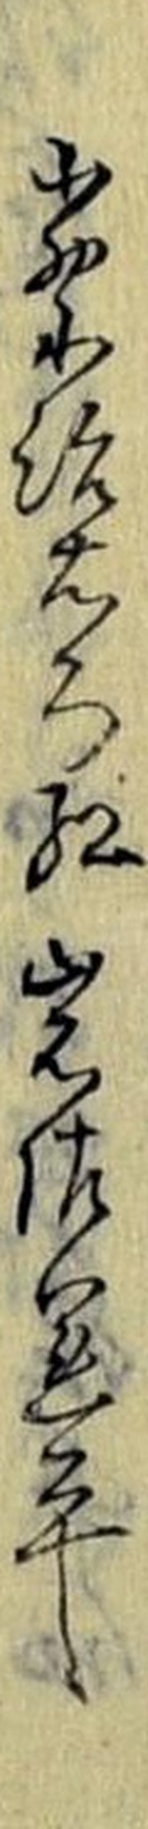小栗治左衛門組岩佐運平
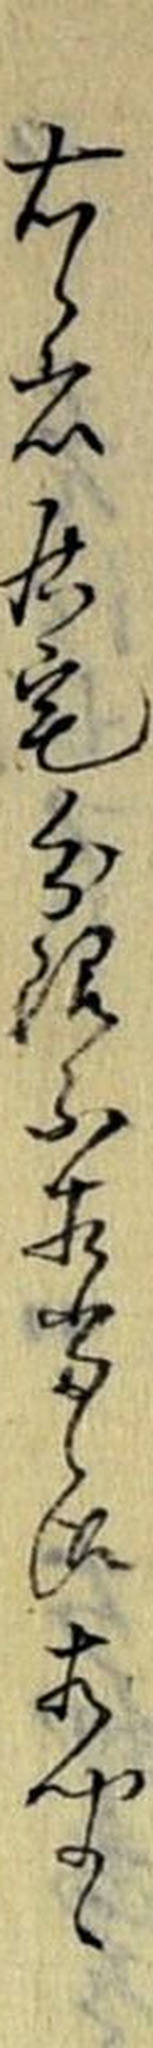右之者居宅分限不相当之趣相聞候
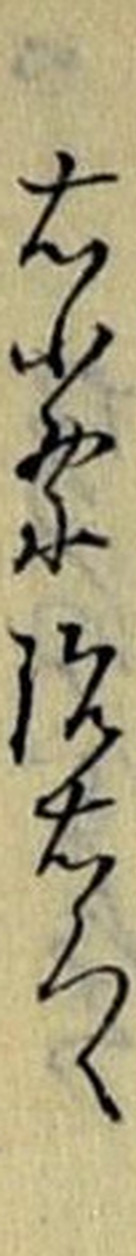右小栗治左衛門へ
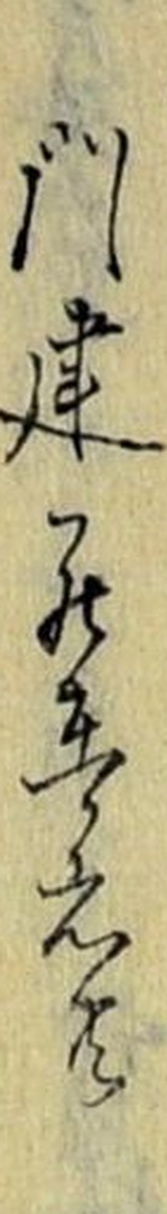門建罷在候者共
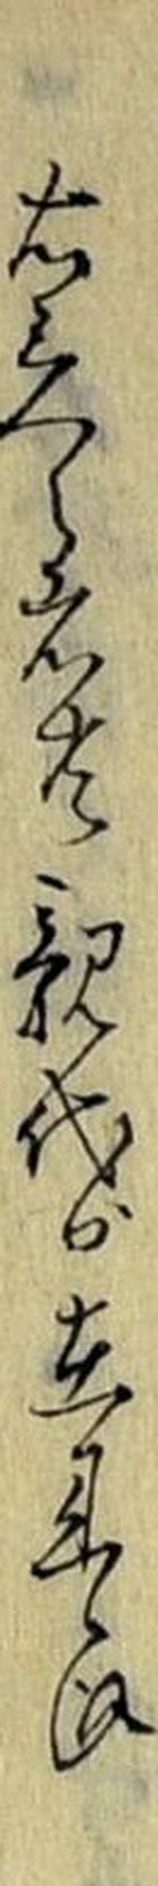右三人之者共親代ゟ在来趣
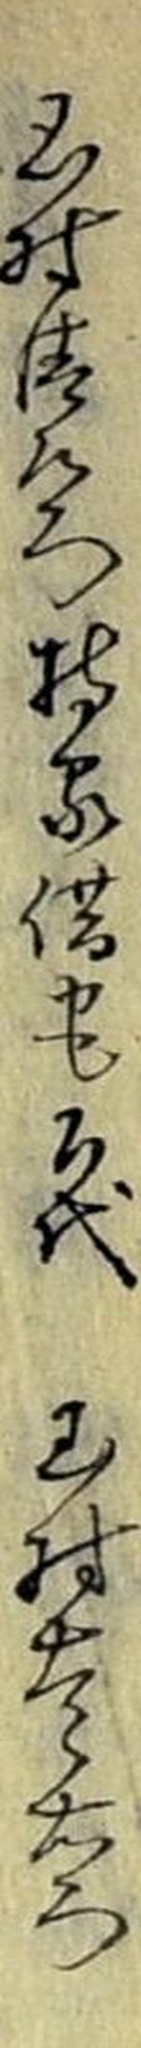玉村清左衛門持家借宅下代玉村太郎右衛門
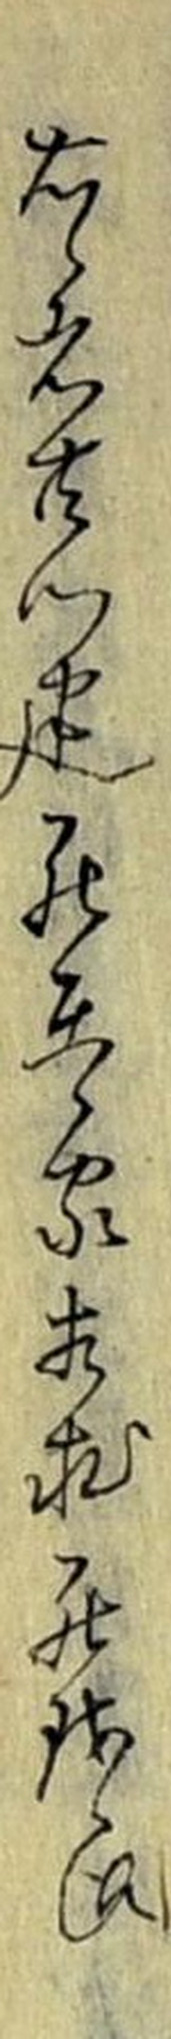右之者共門建罷在候家求罷越候趣
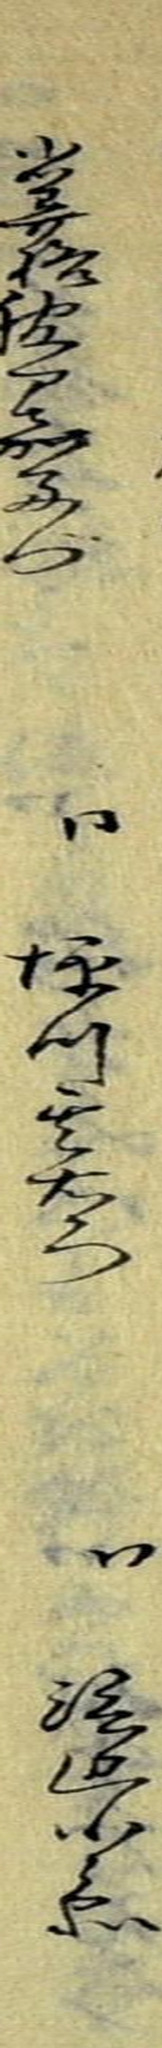小算格服部嘉多右衛門同坪川其右衛門同渡辺小兵衛

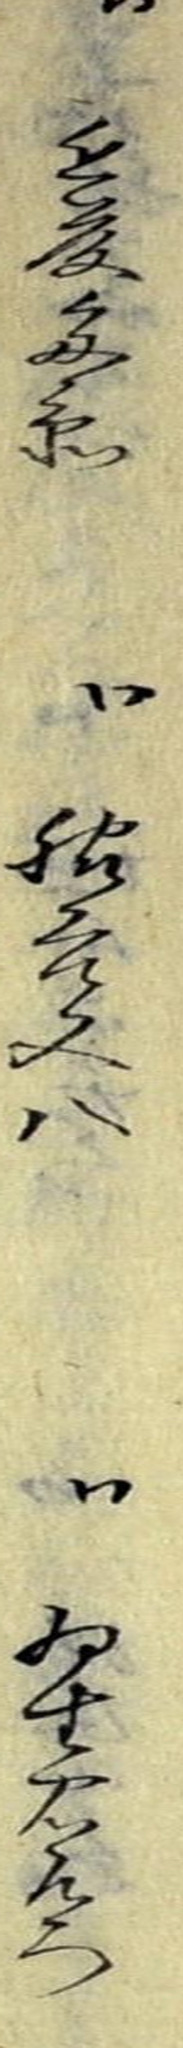同近藤多兵衛同脇谷又八同羽生忠左衛門
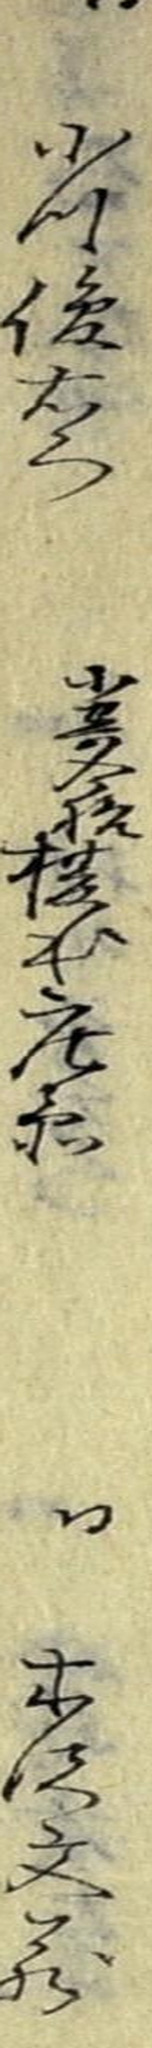同小川俊右衛門榎本庄兵衛同小沢文蔵
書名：命令之部 六
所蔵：福井県文書館 Fukui Prefectural Archives
